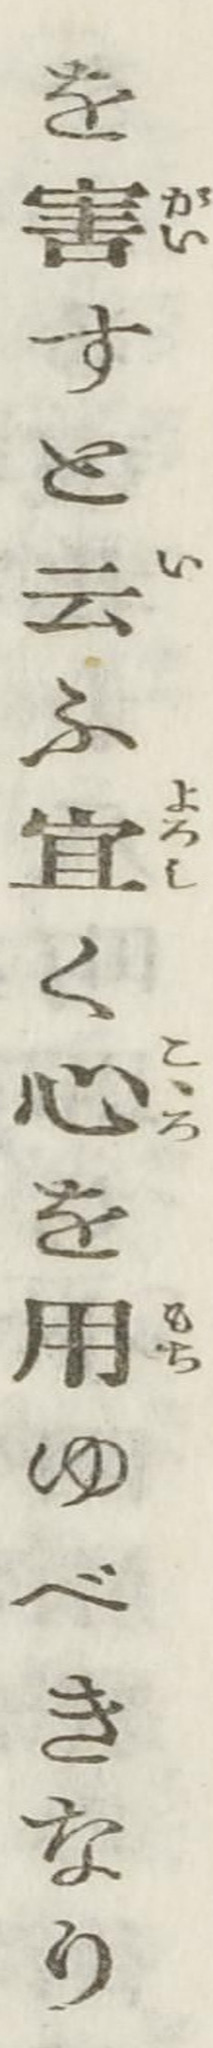を害すと云ふ宜く心を用ゆるべきなり
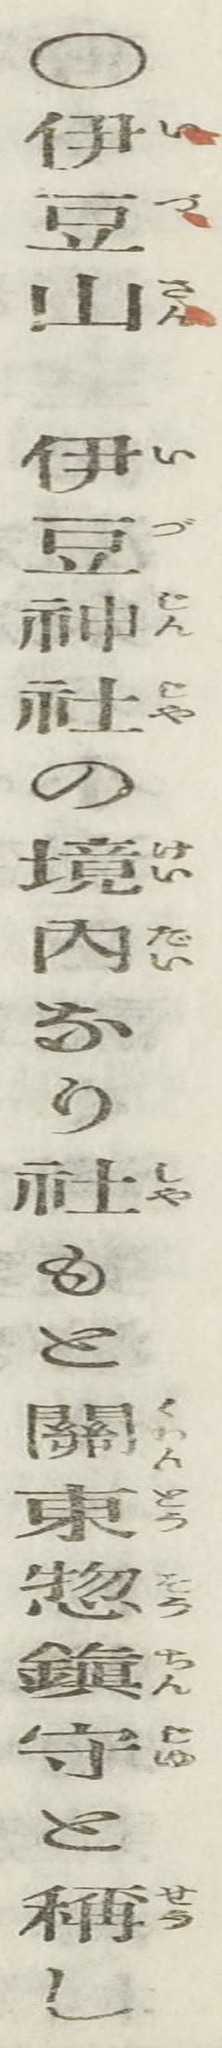○伊豆山伊豆神社の境内なり社もと関東惣鎮守と称し
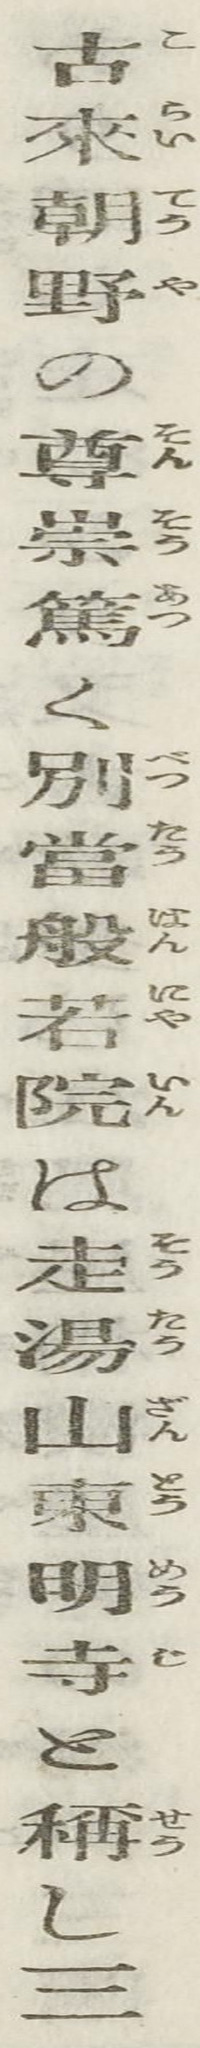古来朝野の尊崇篤く別当般若院は走湯山東明寺と称し三
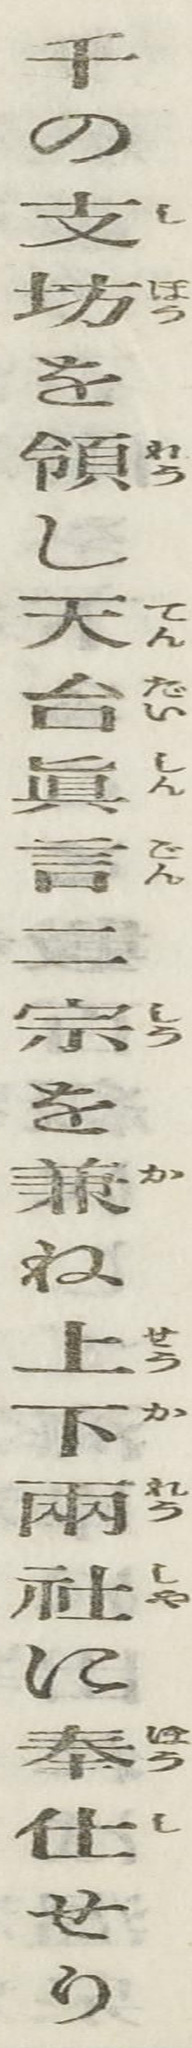千の支坊を領し天台真言二宗を兼ね上下両社に奉仕せり
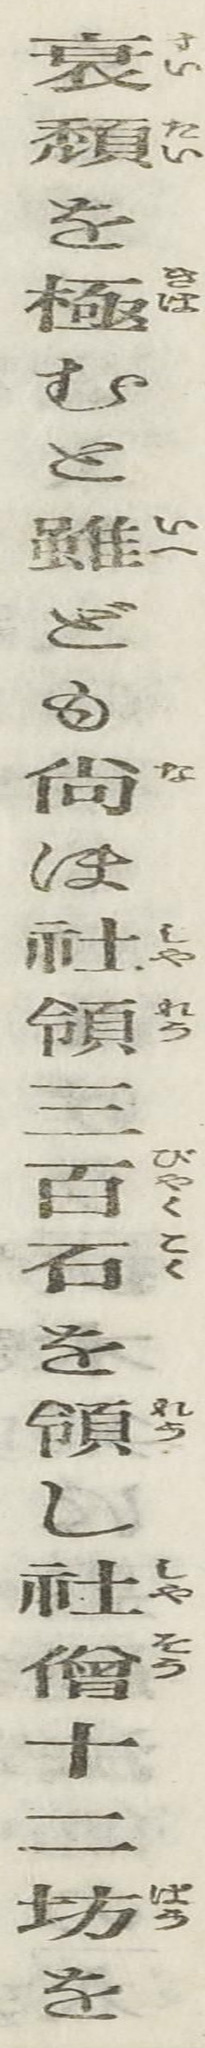衰頽を極むと雖ども尚ほ社領三百石を領し社僧十二坊を
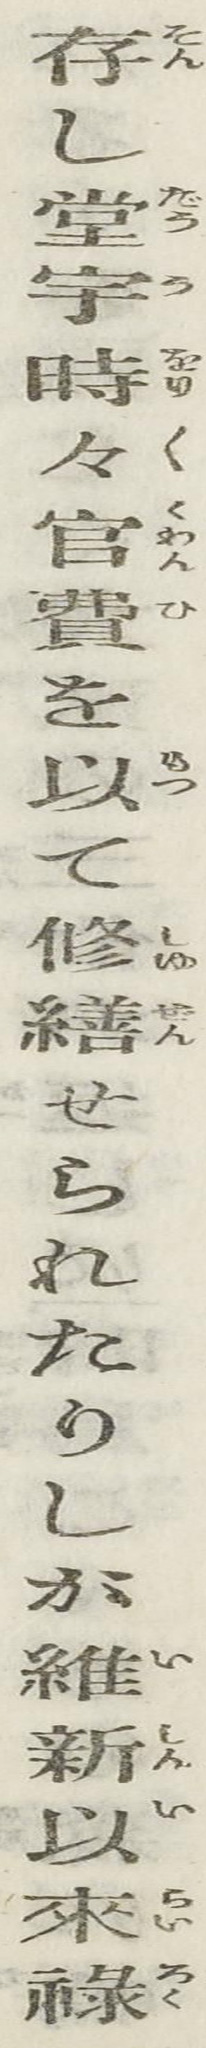存し堂宇時々官費を以て修繕せられたりしが維新以来禄
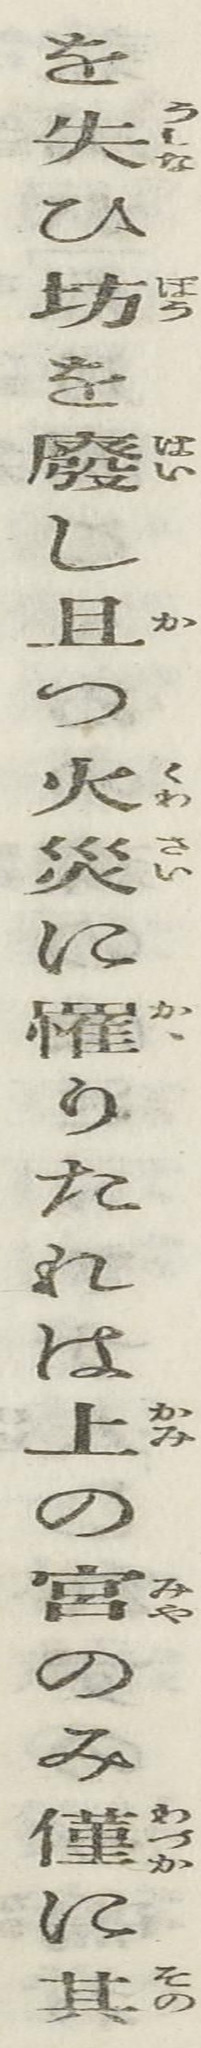を失ひ坊を廃し且つ火災に罹りたれは上の宮のみ僅に其
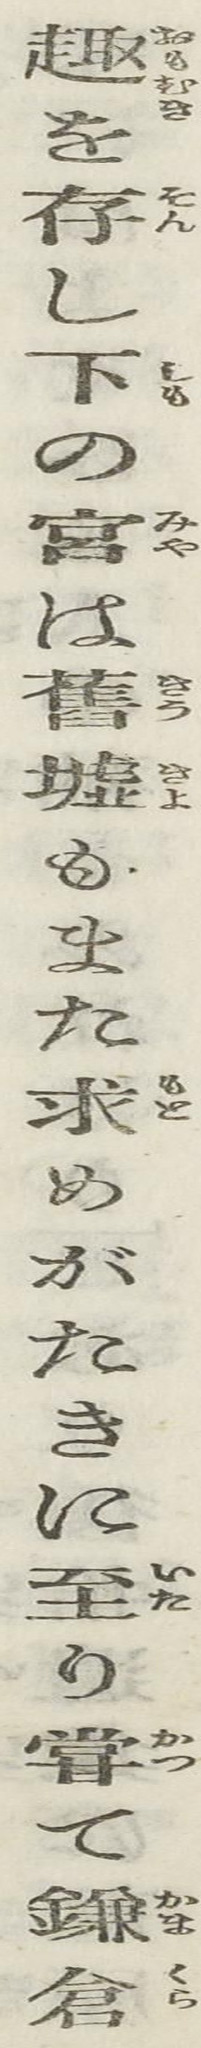趣を存し下の宮は旧墟もまた求めがたきに至り嘗て鎌倉
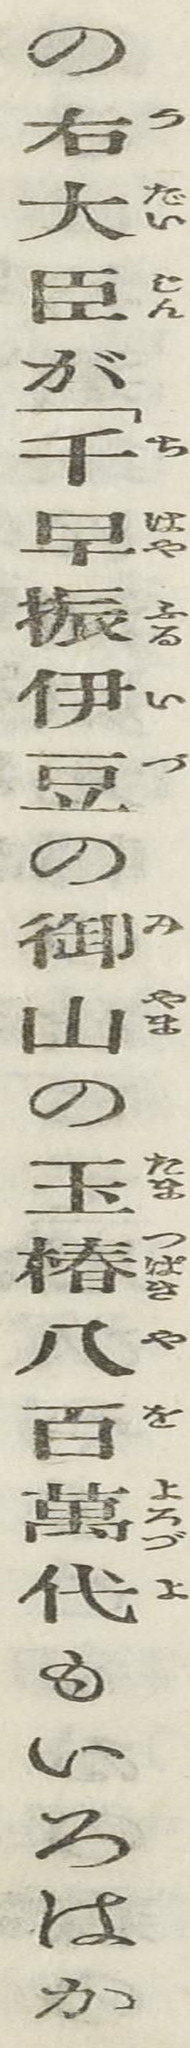の右大臣が「千早振伊豆の御山の玉椿八百萬代もいろはか

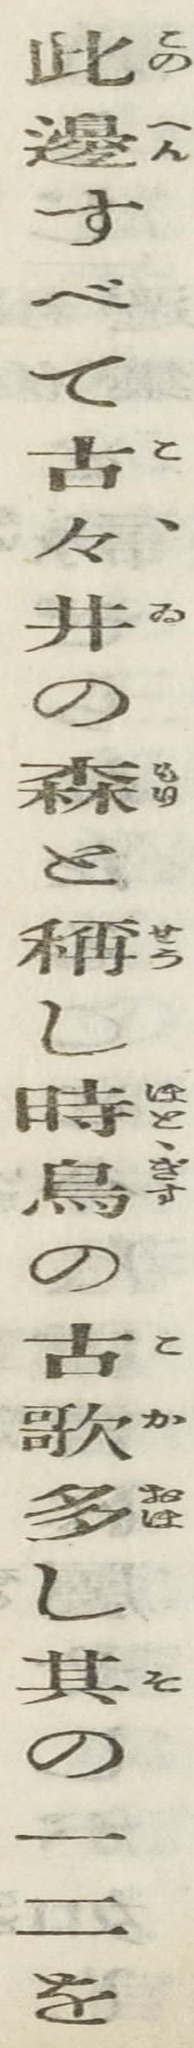此邊すべて古々井の森と称し時鳥の古歌多し其の一二を
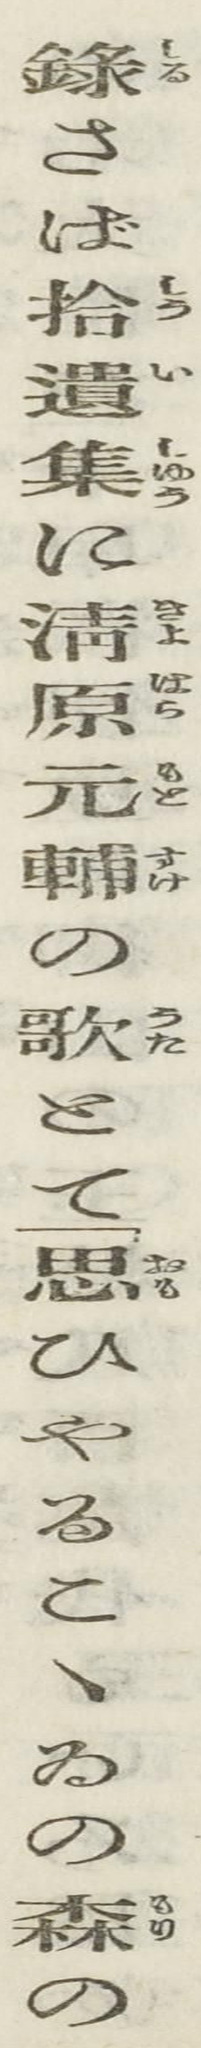録さば拾遺集に清原元輔の歌とて「思ひやるこゝゐの森の
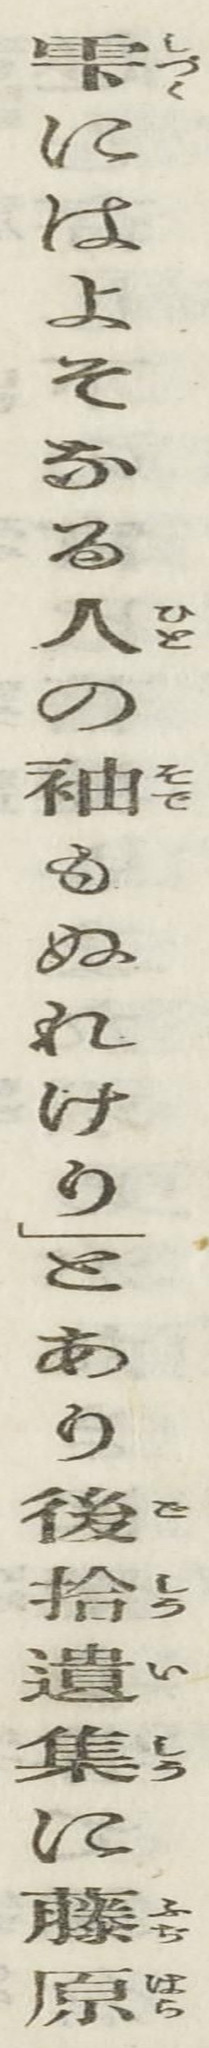雫にはよそなる人の袖もぬれけり」とあり後拾遺集に藤原
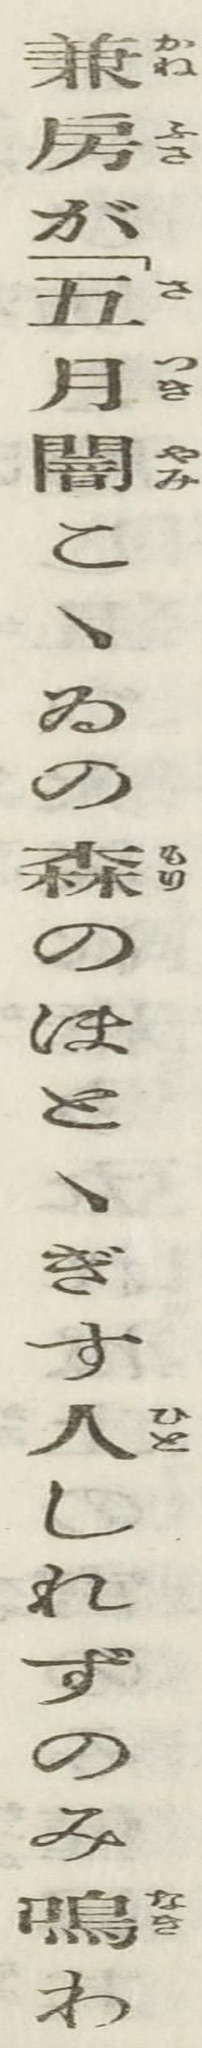兼房が「五月闇こゝゐの森のほとゝぎす人しれずのみ鳴わ
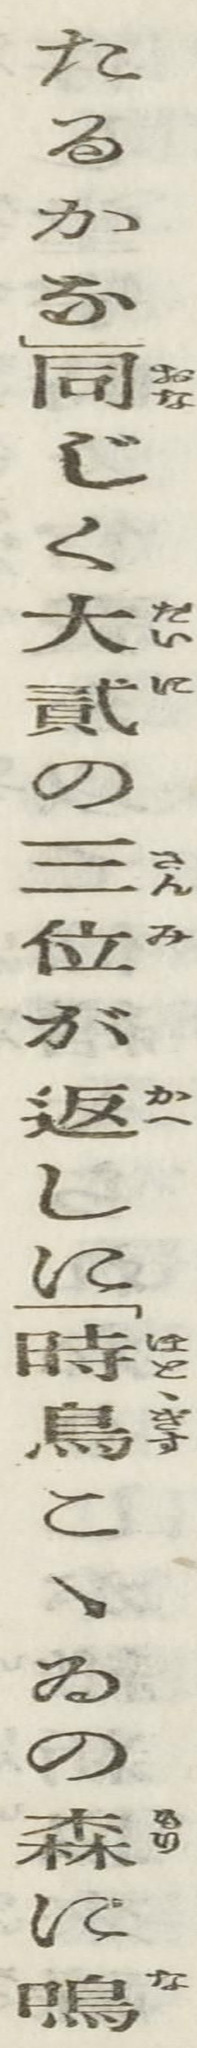たるかな」同じく大貮の三位が返しに「時鳥こヽゐの森に鳴
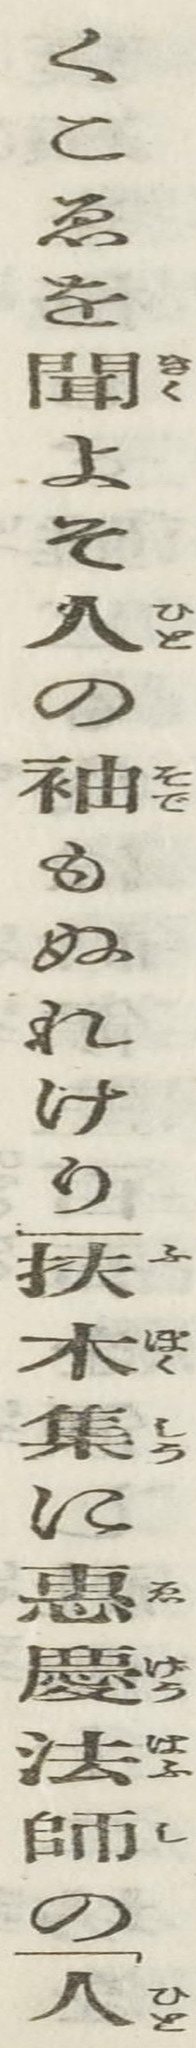くこゑを聞よそ人の袖もぬれけり」扶木集に惠慶法師の「人
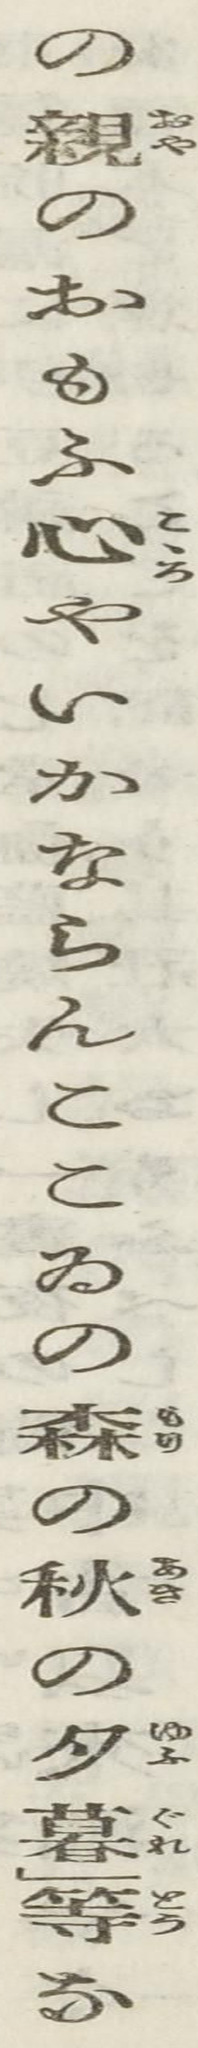の親のおもふ心やいかならんここゐの森の秋の夕暮」等な
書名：熱海獨案内　全
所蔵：東京大学地震研究所図書室 Earthquake Research Institute Library, The University of Tokyo, JAPAN
